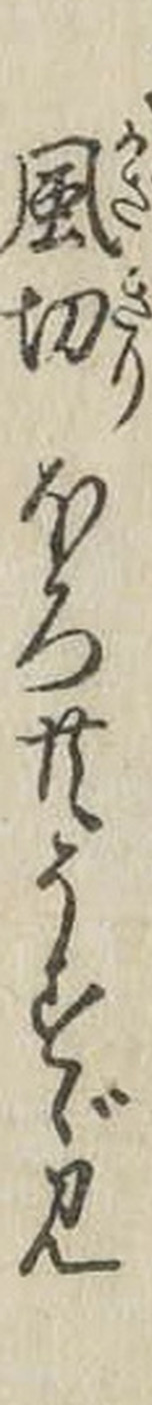風切ほろ共うすゞみ
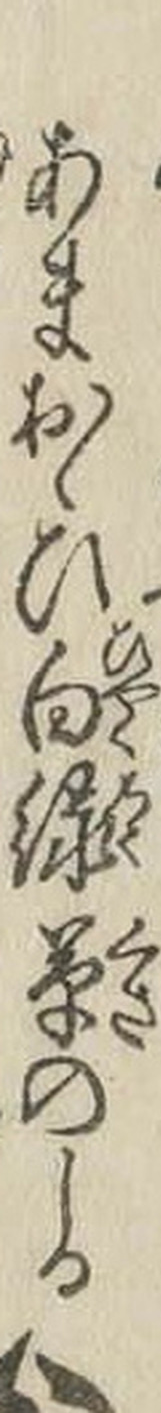あまおゝひ白緑草のしる
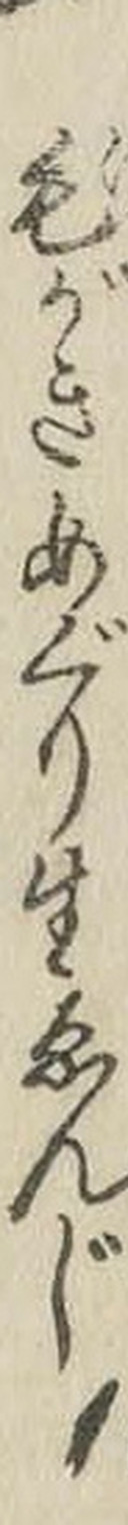毛がきめぐり生ゑんじ
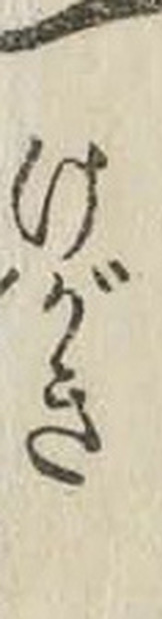けがき
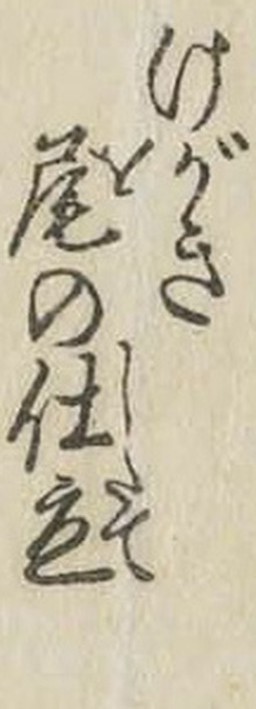尾の仕立
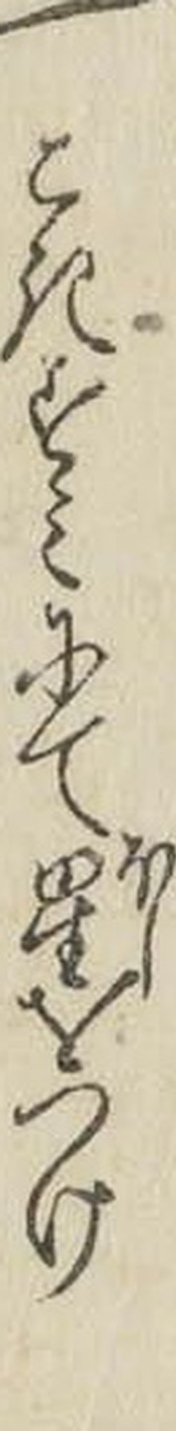こきすみにて星をつけ
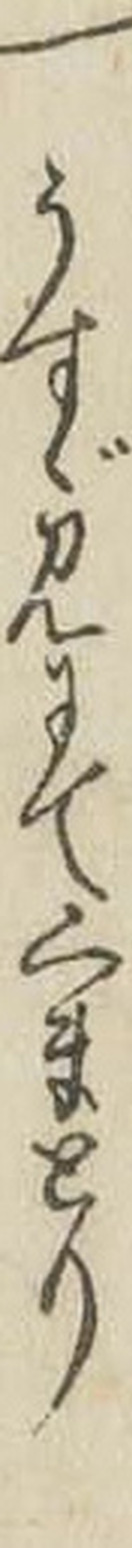うすゞみにてくまとり
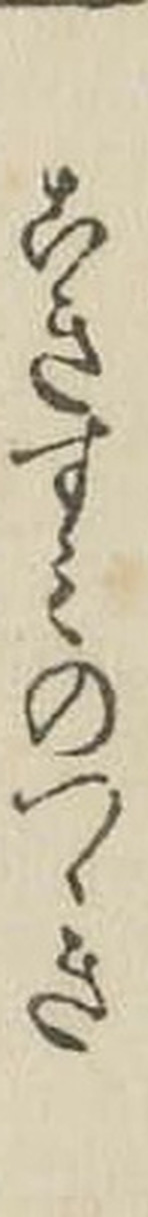こきすみのつゝき
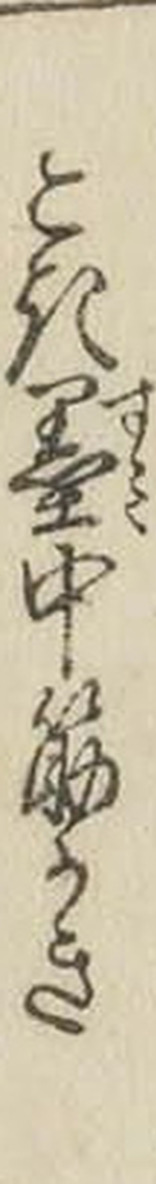こき墨中筋かき
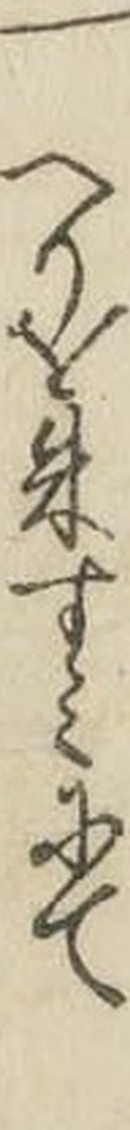へりを朱すみにて

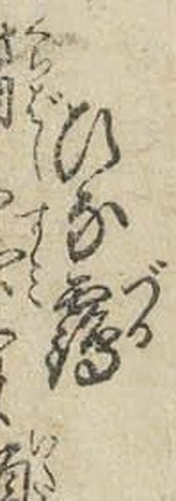ひな鶴
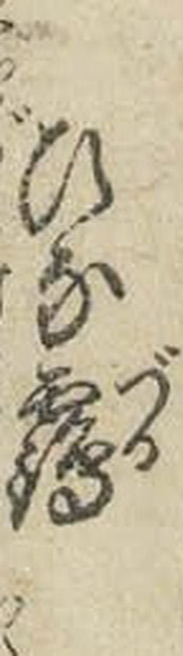ひな鶴
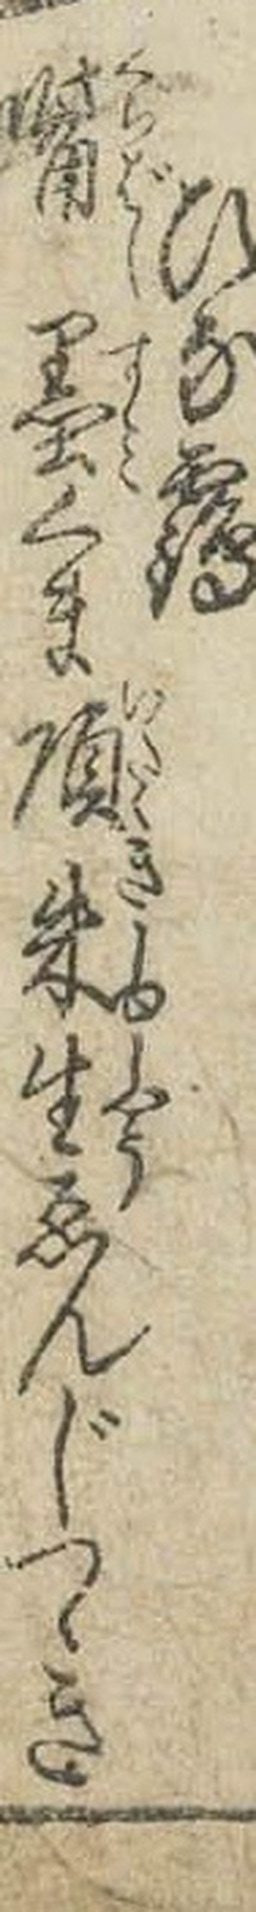嘴墨くま頂朱生ゑんんじつゝき
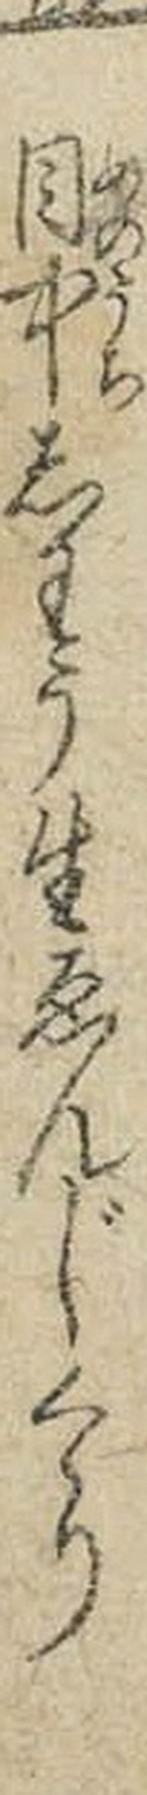目中しわう生ゑんじくゝり
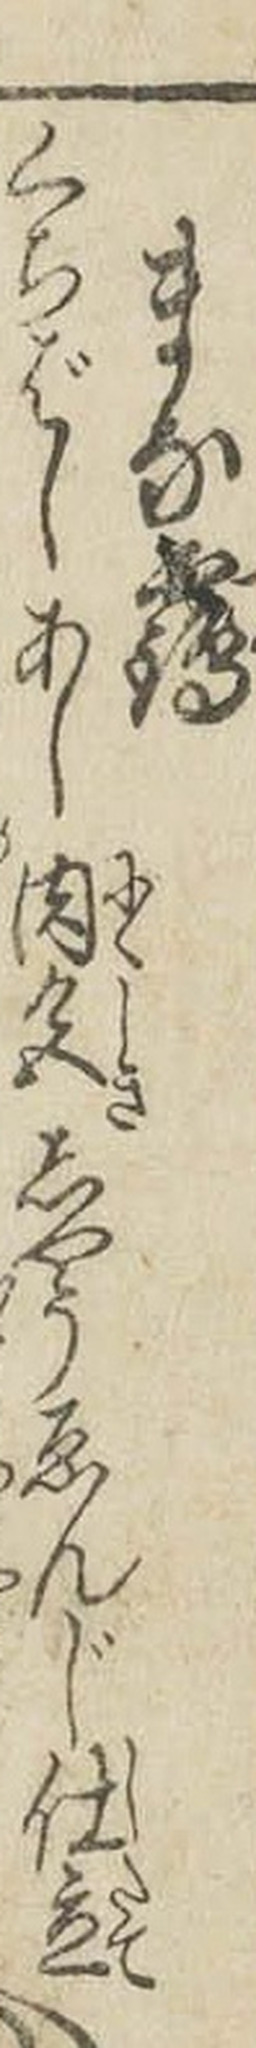くちばしあし肉色しやうゑんじ仕立
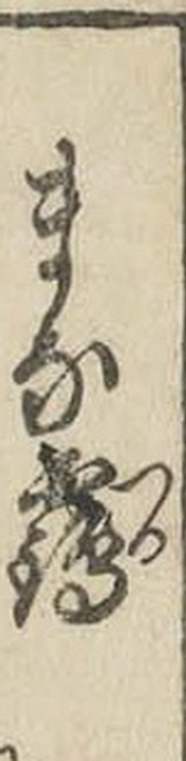まな鶴
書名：絵本写宝袋 9巻 8之巻
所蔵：東京学芸大学教育コンテンツアーカイブ
